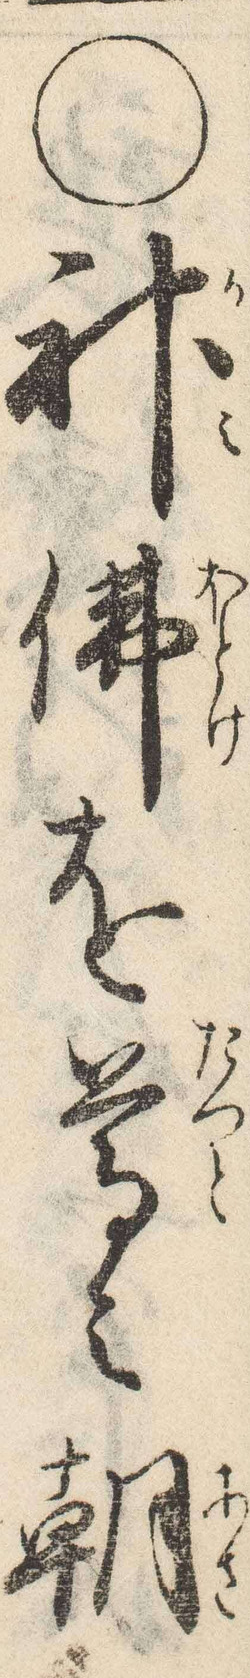〇神仏を尊み朝
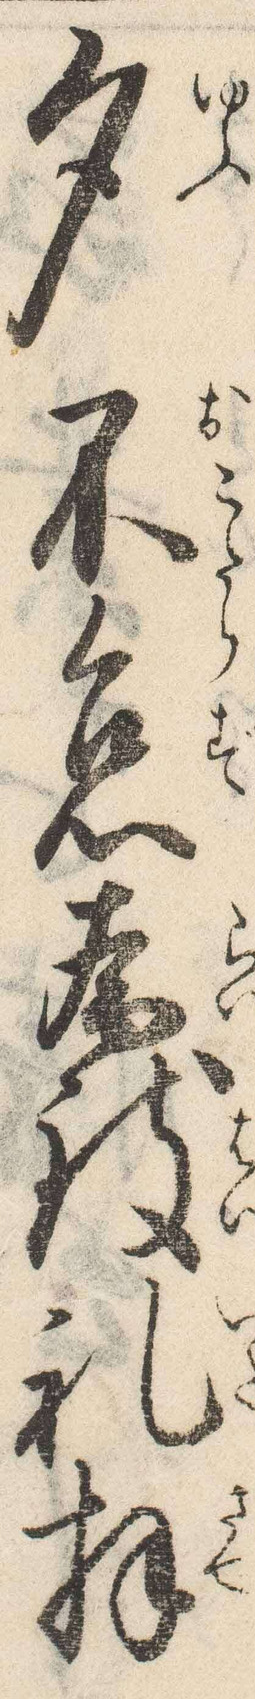夕不怠為致礼背拝
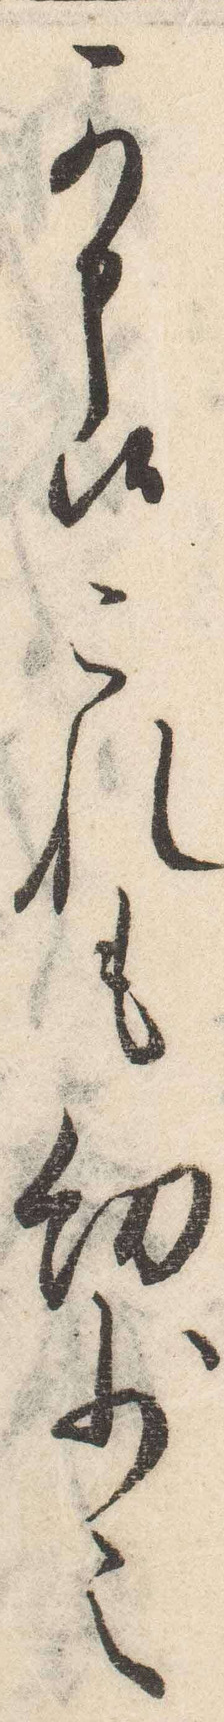可申候これも幼少之
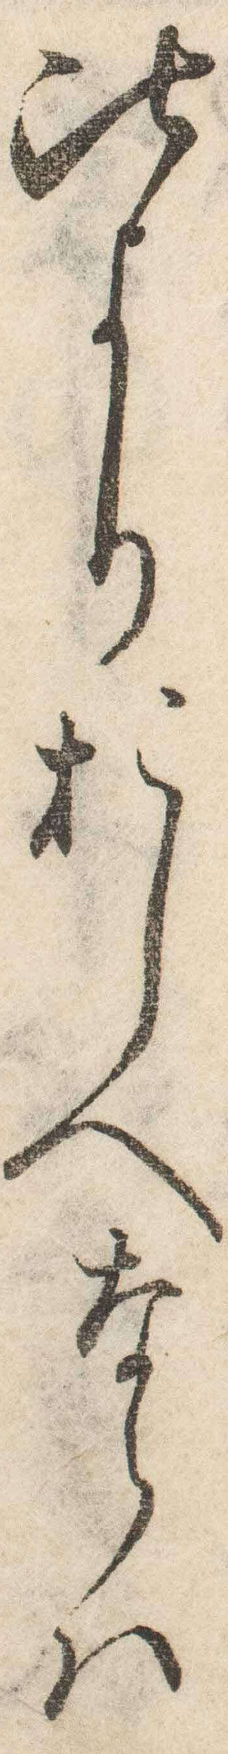比よりおしへならは
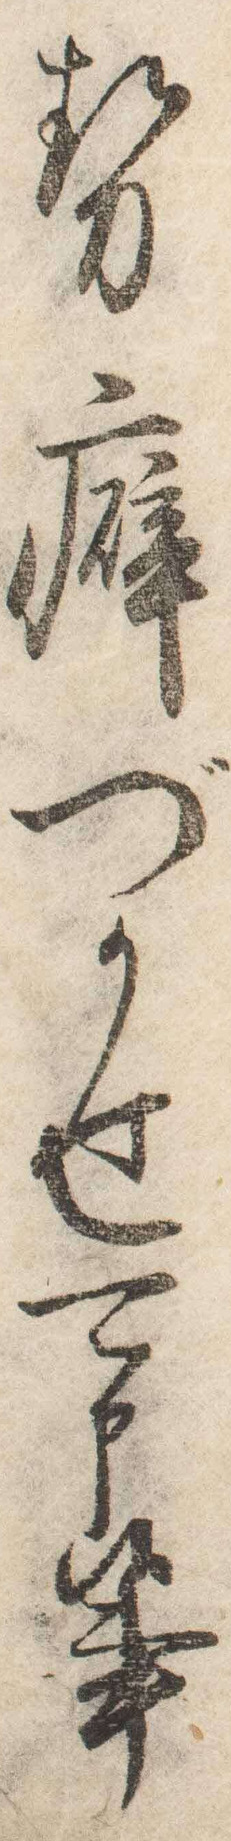せ癖づかせ可申候事

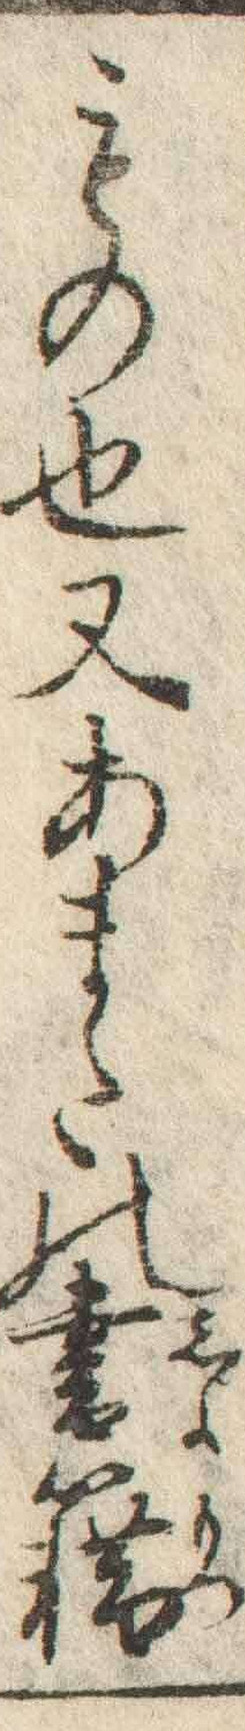もの也又あまたの書籍
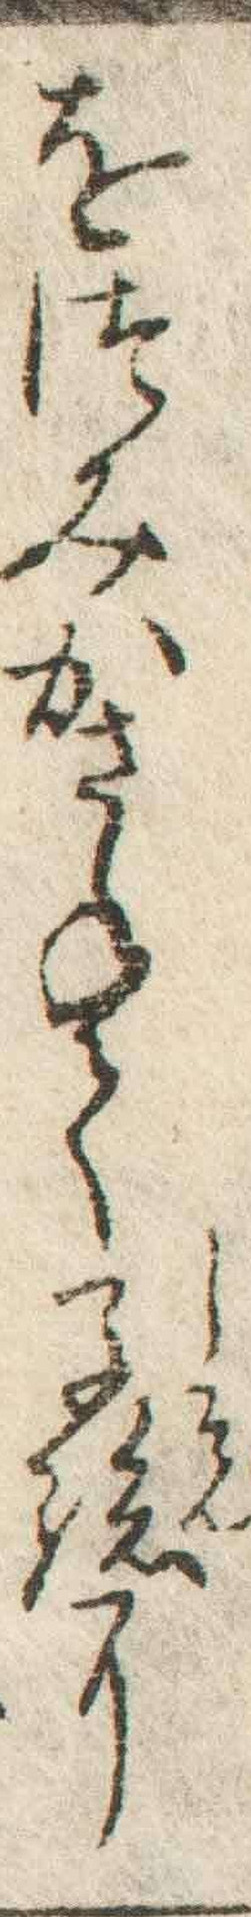をつみかせねて子孫に
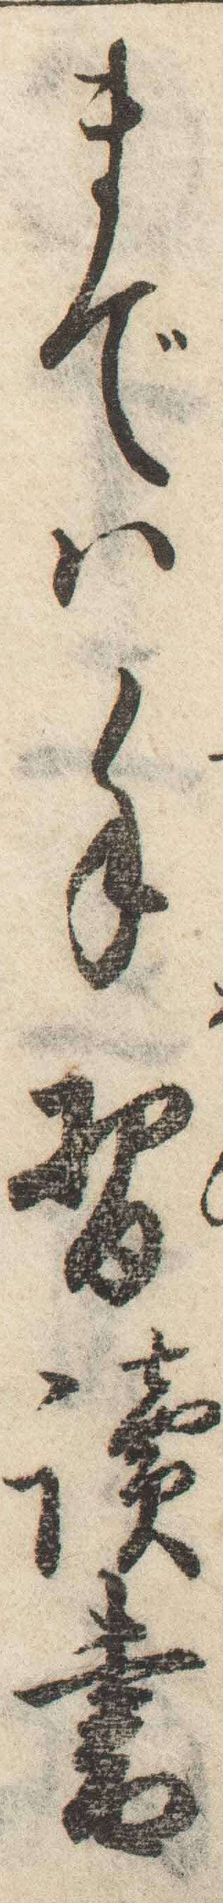までは手習読書
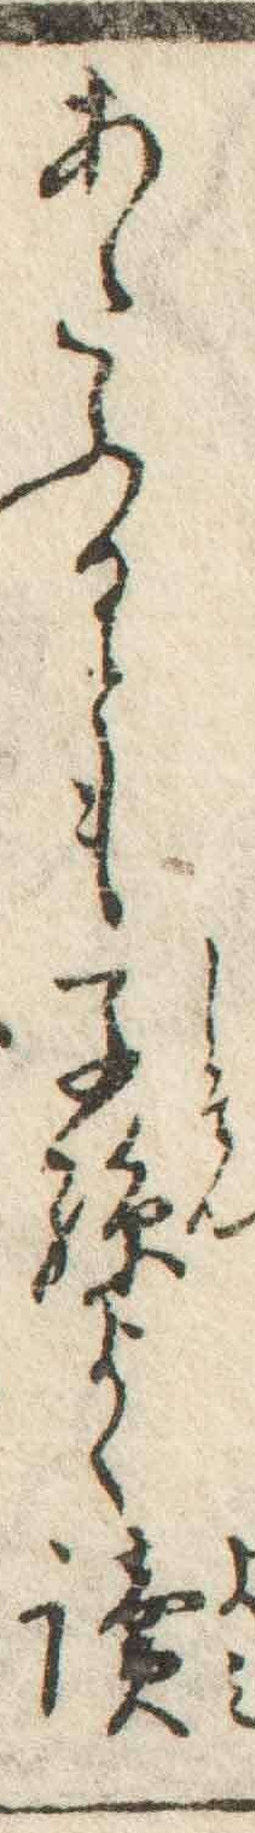あたふるとも子孫よく読
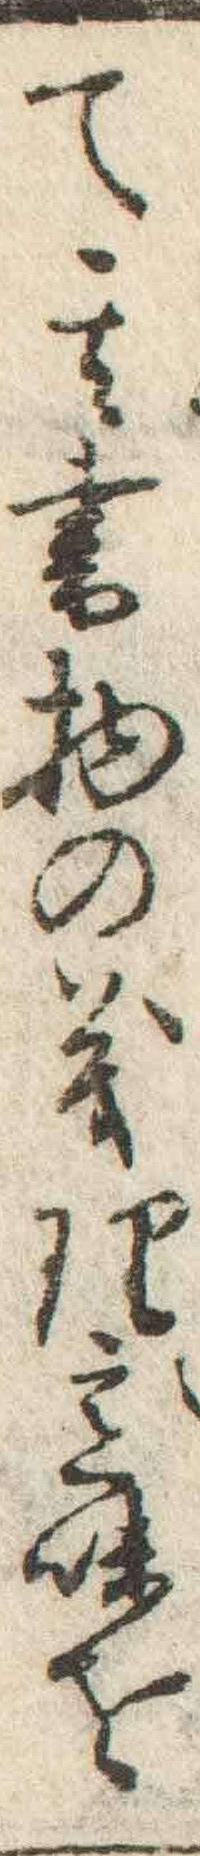て其書物の義理意味を
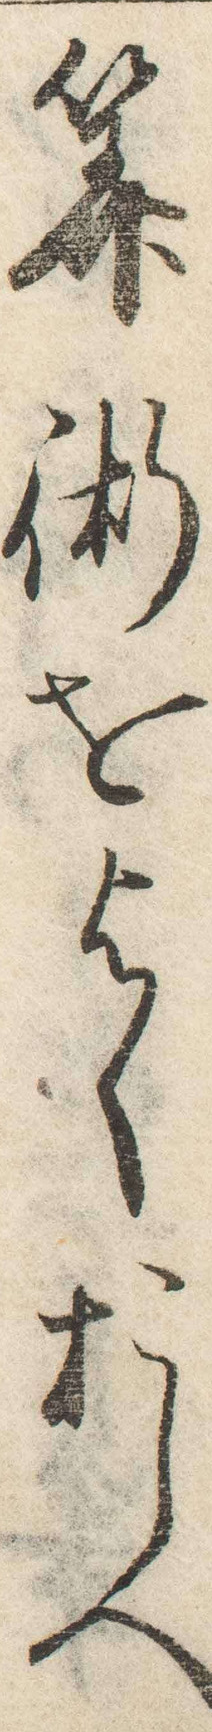算術をよくおしへ
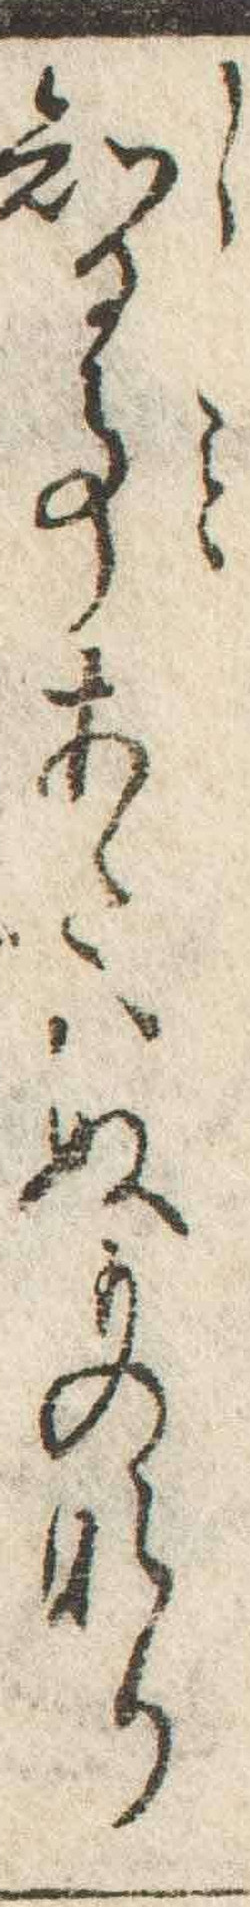知る事あたはぬものなり
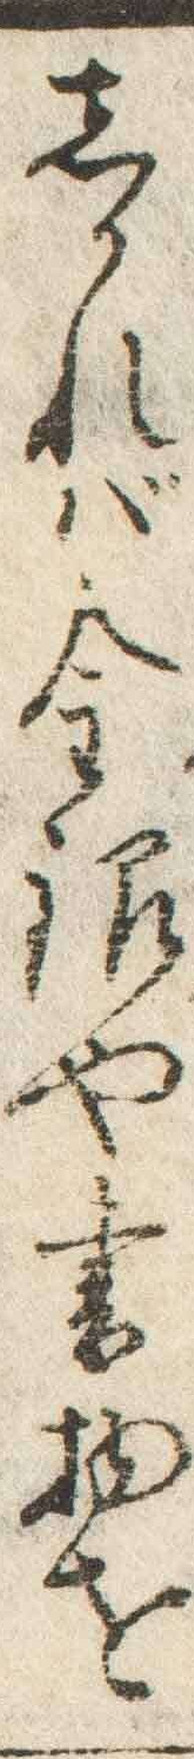しかれば金銀や書物を
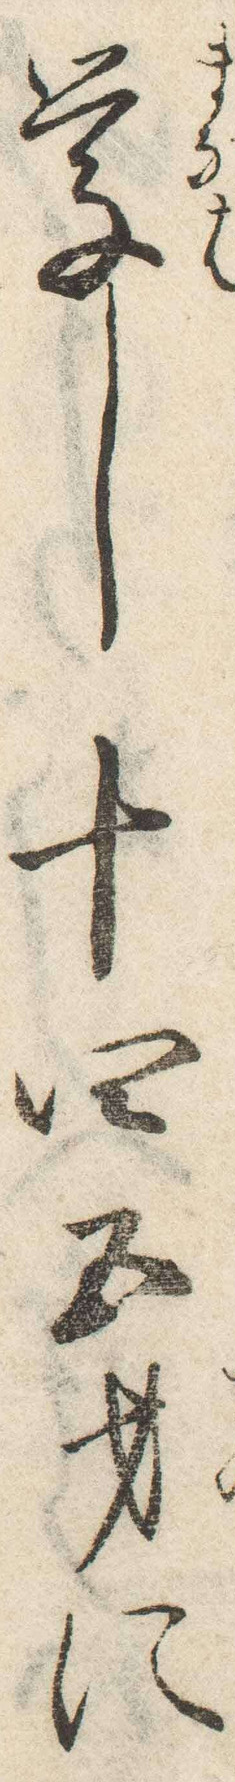学し十四五才に
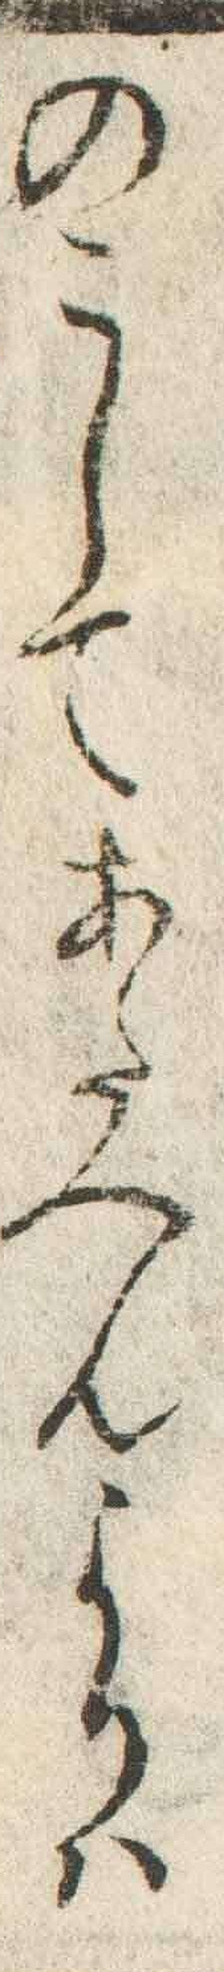のこしてあたへんよりは
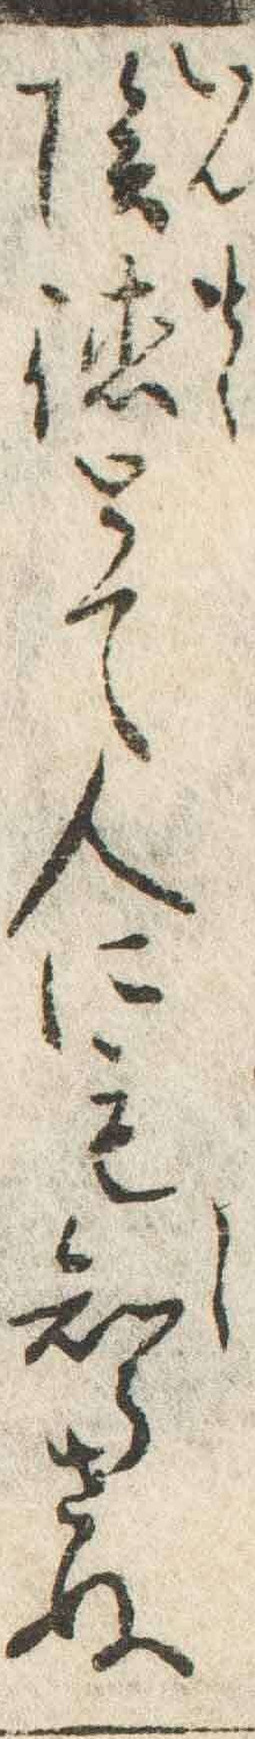陰徳とて人にも知らさぬ
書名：撫育草
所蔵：東京学芸大学附属図書館 国文学研究資料館
